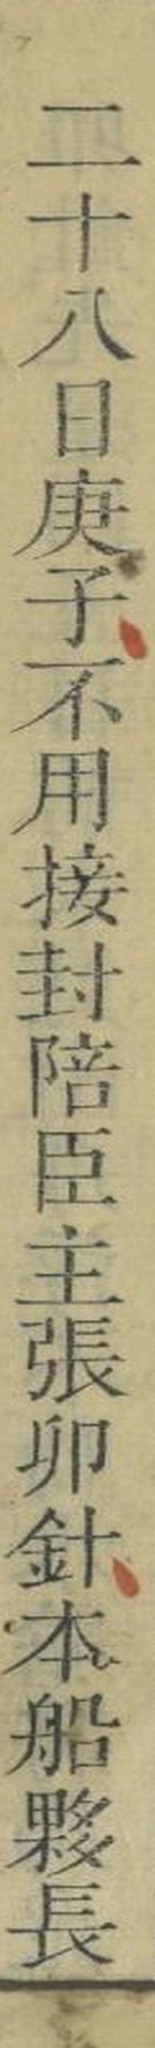二十八日庚子不用接封陪臣主張卯針本船夥長
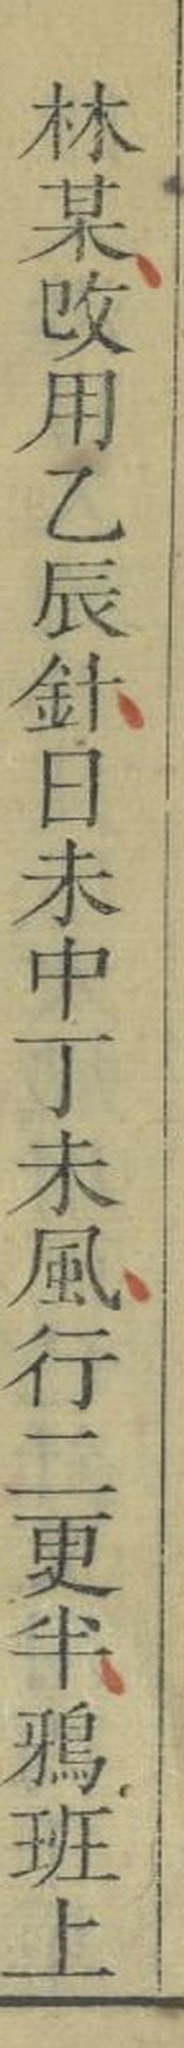林某攺用乙辰針日未中丁未風行二更半鴉班上
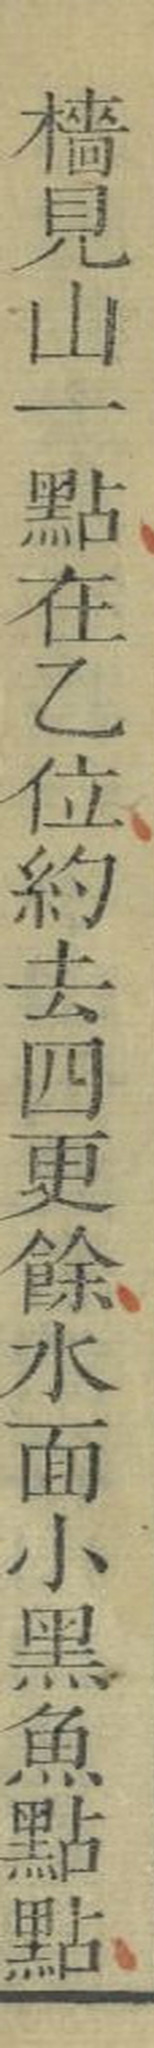檣見山一點在乙位約去四更餘水面小黑魚點點
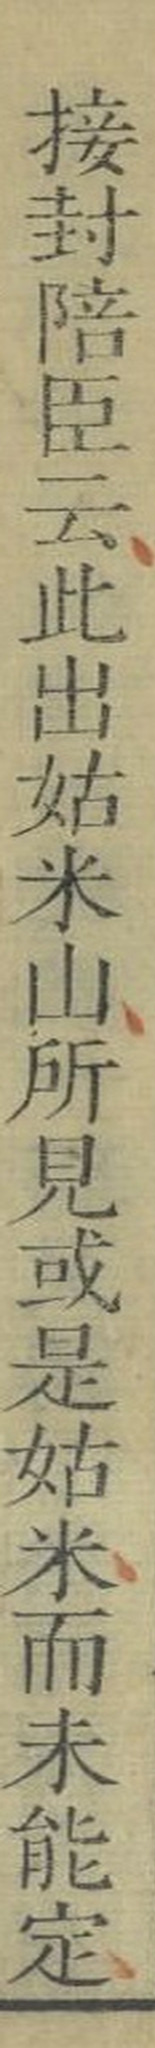接封陪臣云此出姑米山所見或是姑米而未能定
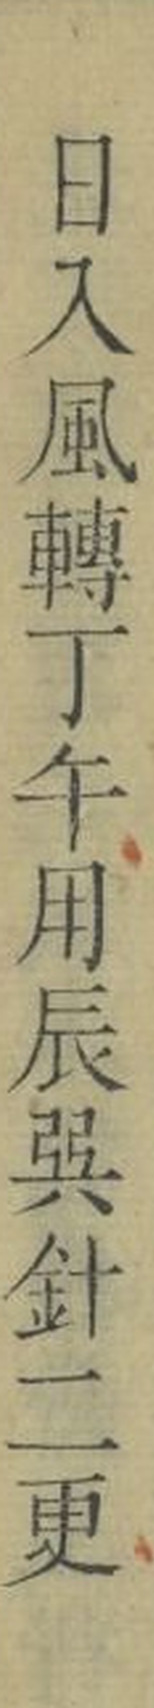日入風轉丁午用辰㢲針二更
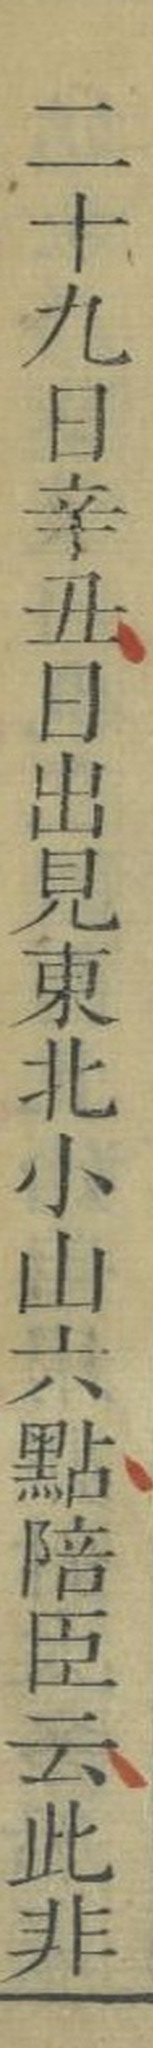二十九日辛丑日出見東北小山六點陪臣云此非

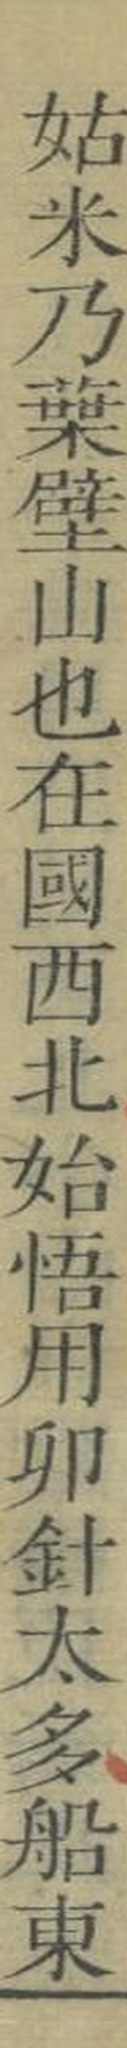姑米乃葉壁山也在國西北始悟用卯針太多船東
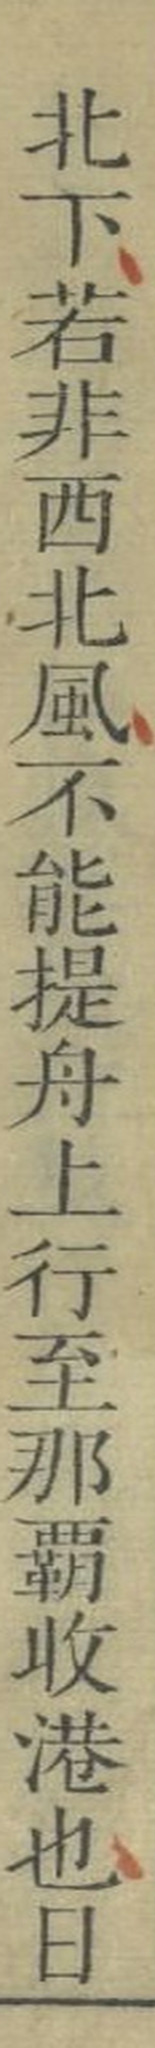北下若非西北風不能提舟上行至那覇收港也日
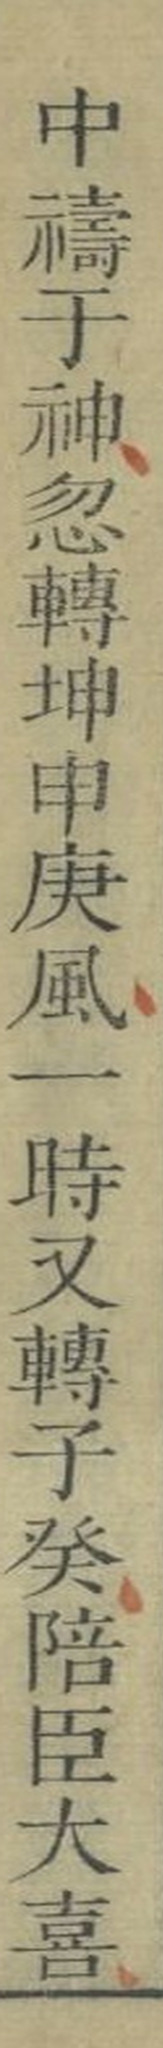中禱于神忽轉坤申庚風一時又轉子癸陪臣大喜
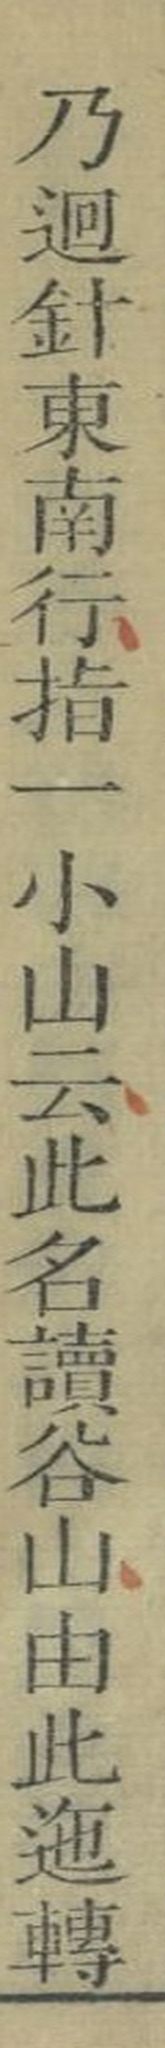乃迴針東南行指一小山云此名讀谷山由此迤轉
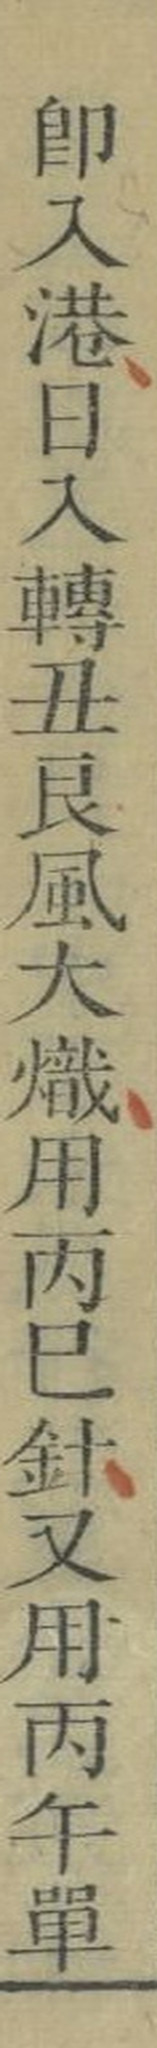卽入港日入轉丑艮風大熾用丙巳針又用丙午單
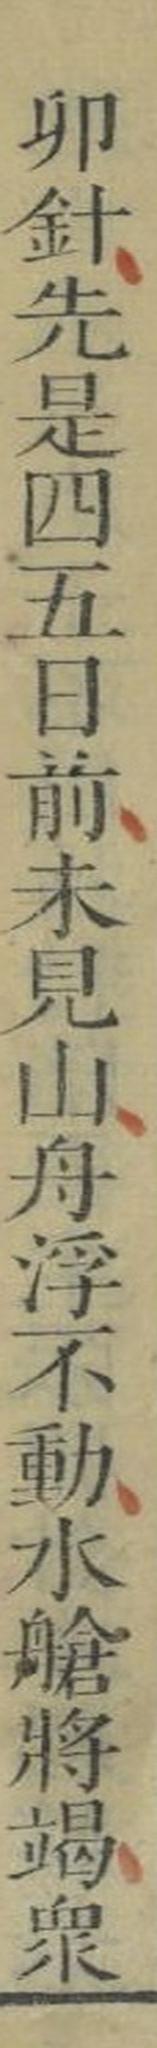卯針先是四五日前未見山舟浮不動水艙將竭衆
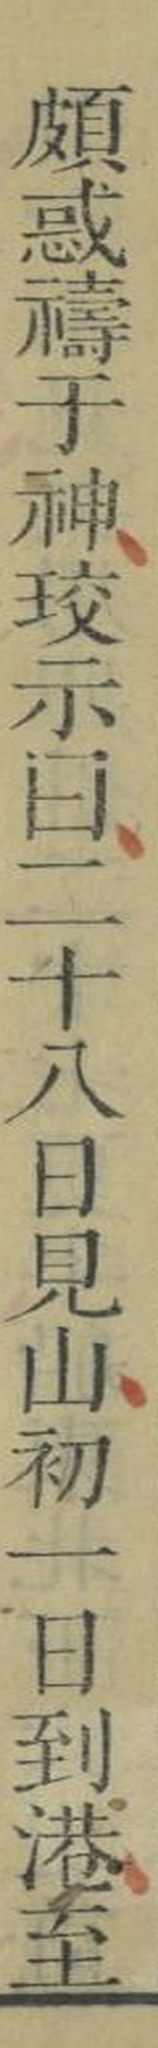頗惑禱于神珓示曰二十八日見山初一日到港至
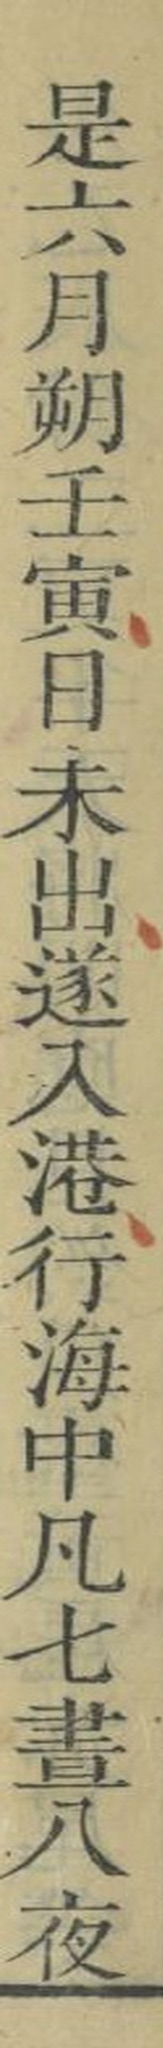是六月朔壬寅日未出遂入港行海中凡七晝八夜
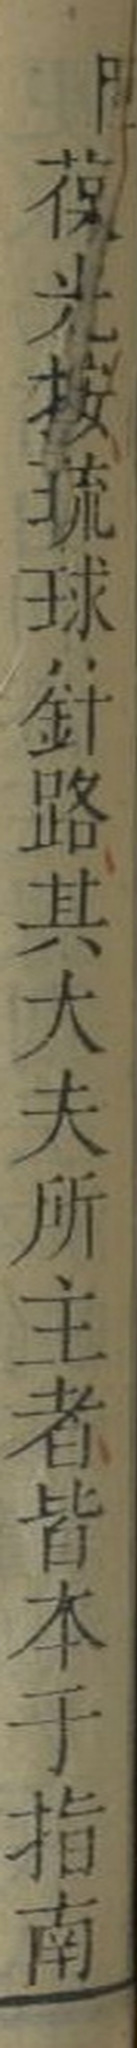臣葆光按琉球針路其大夫所主者皆本于指南
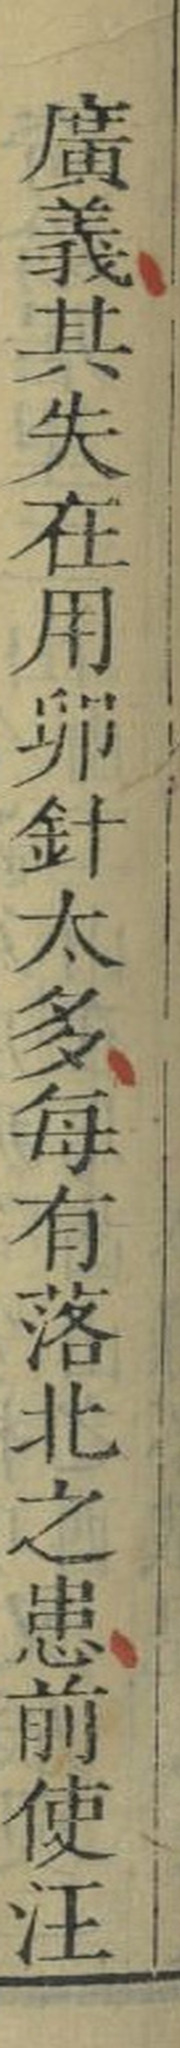廣義其失在用卯針太多每有落北之患前使汪
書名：中山伝信録 巻一、巻二
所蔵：University of the Ryukyus Library
